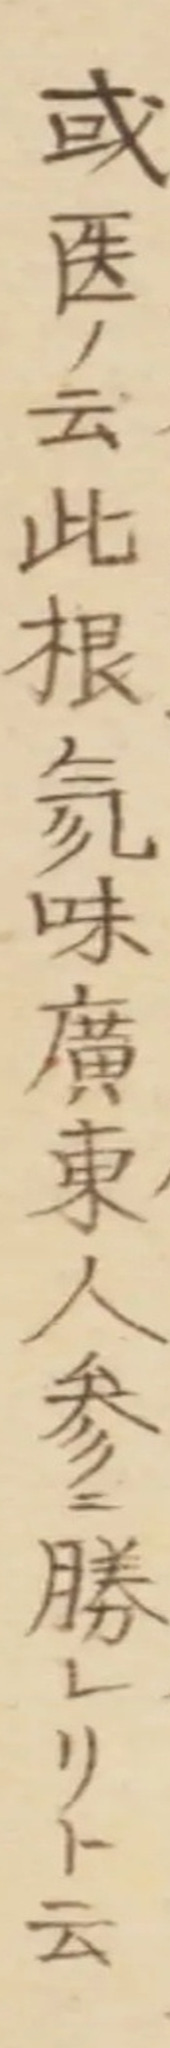或医ノ云此根気味広東人参ニ勝レリト云

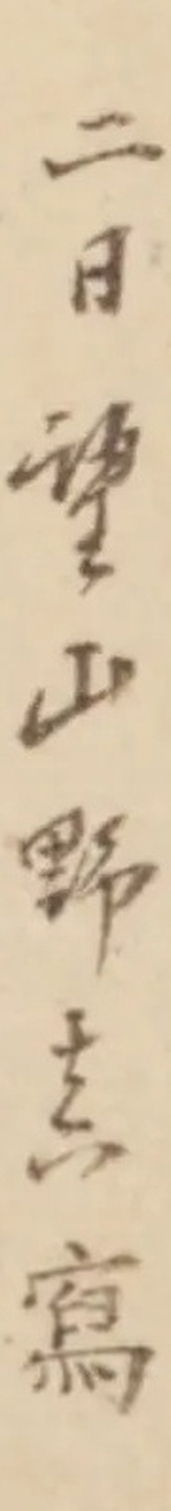二日望山野真写
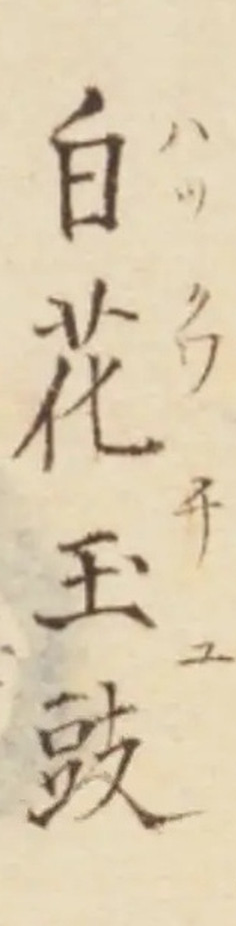白花玉豉

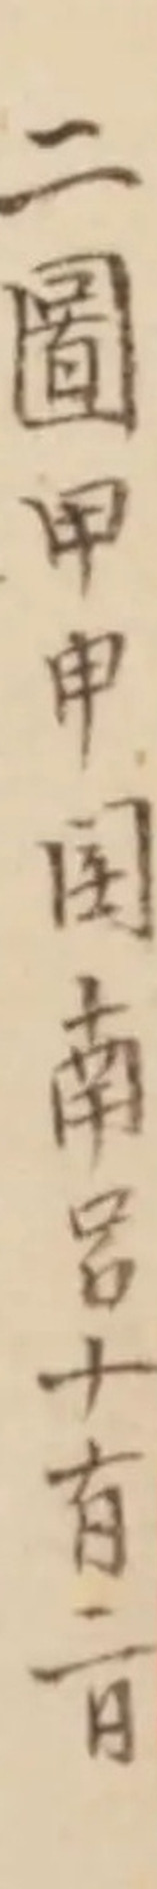二図甲申閏南呂十有二日

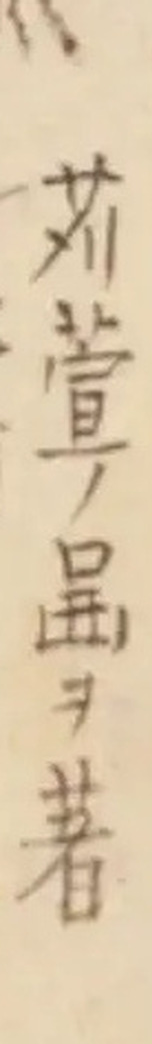苅萱ノヲ著
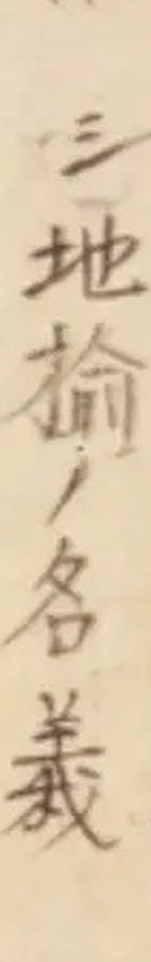シ地楡ノ名義
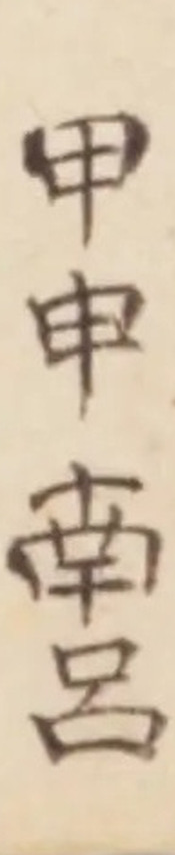甲申南呂
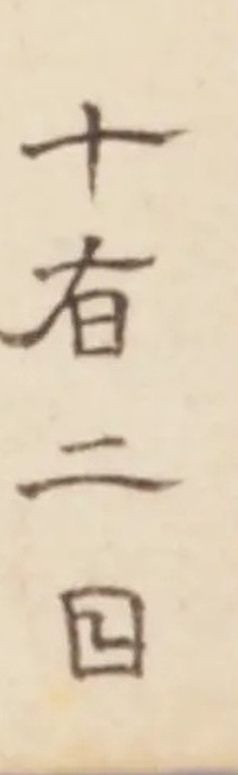十有二日
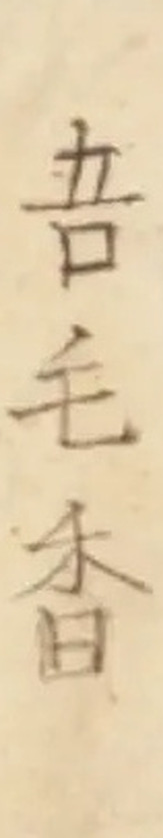吾毛香
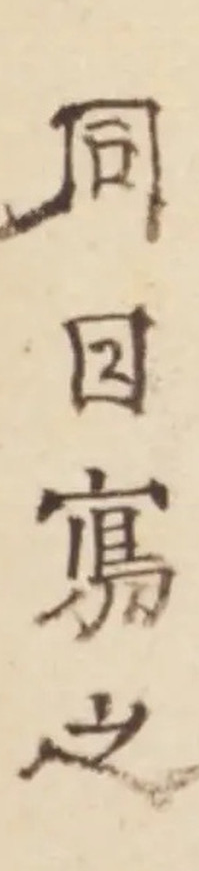同日写之

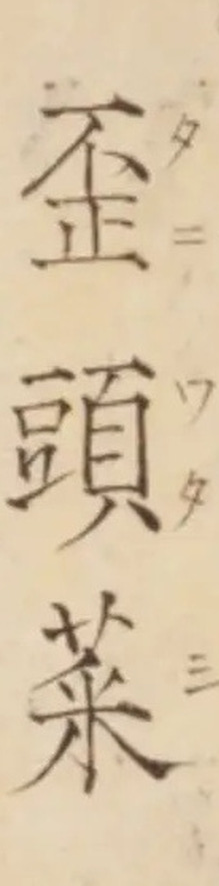歪頭菜

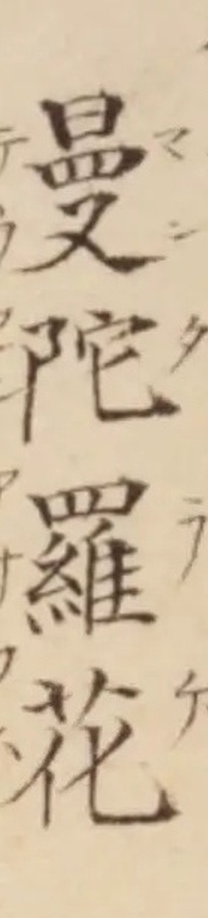曼陀羅花
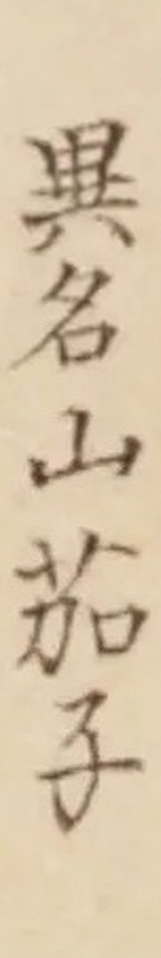異名山茄子
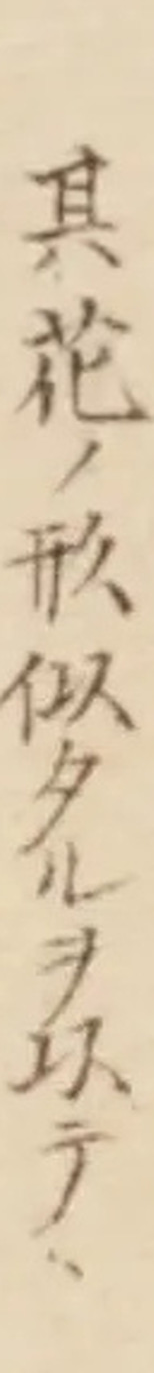其花ノ形似タルヲ以テヽ
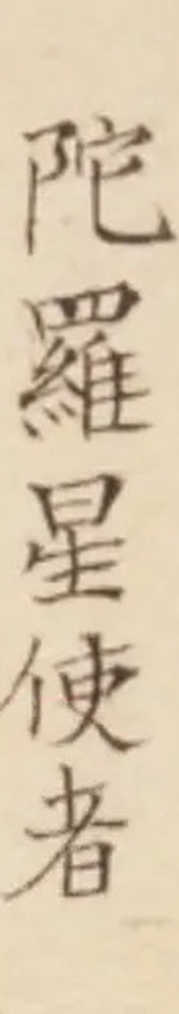陀羅星使者
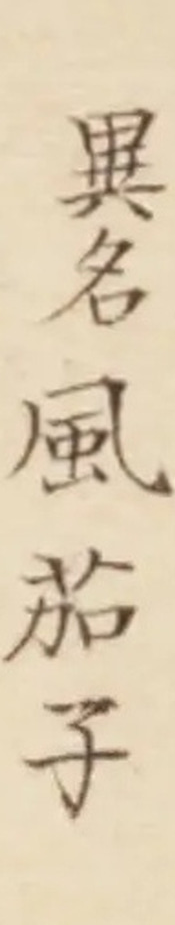異名山茄子
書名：梅園草木花譜秋之部. 2
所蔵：国立国会図書館 National Diet Library, JAPAN
